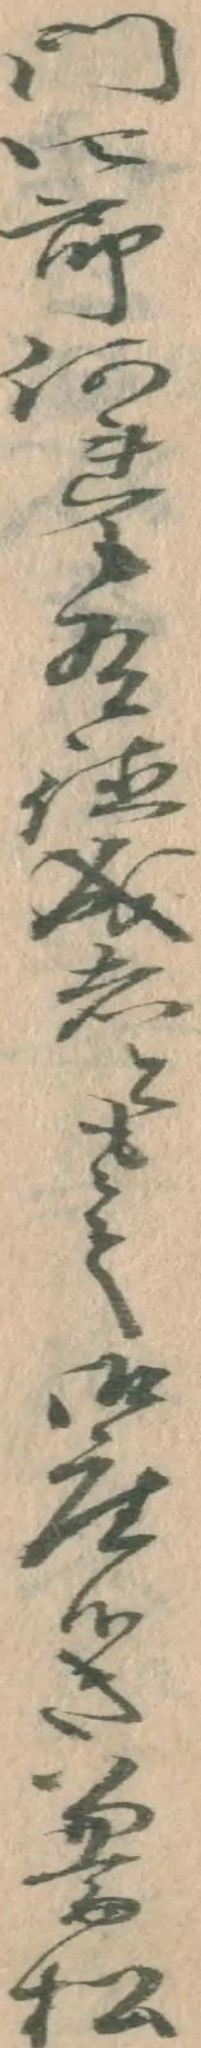門四郎何れも有徳成者ともにて御座候き兼而松
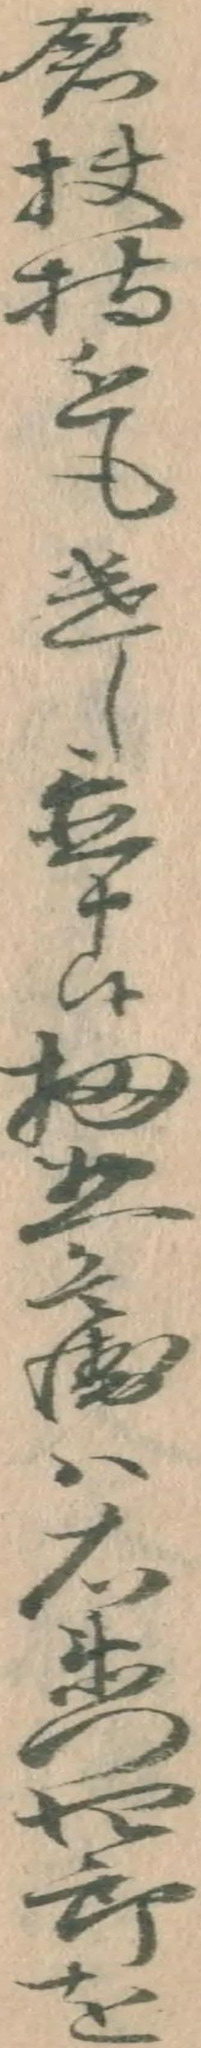倉扶持をも遣し置申候扨惣兵衛は右衛門四郎を
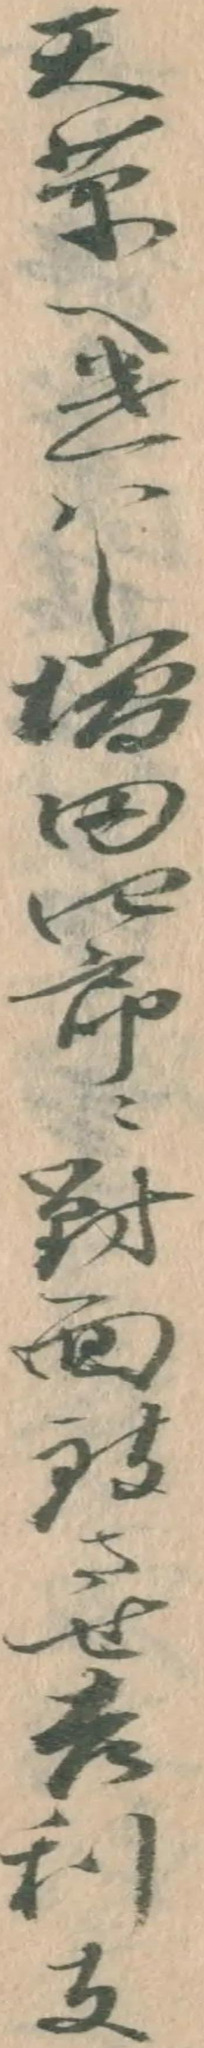天草へ遣はし益田四郎に対面致させ吉利支

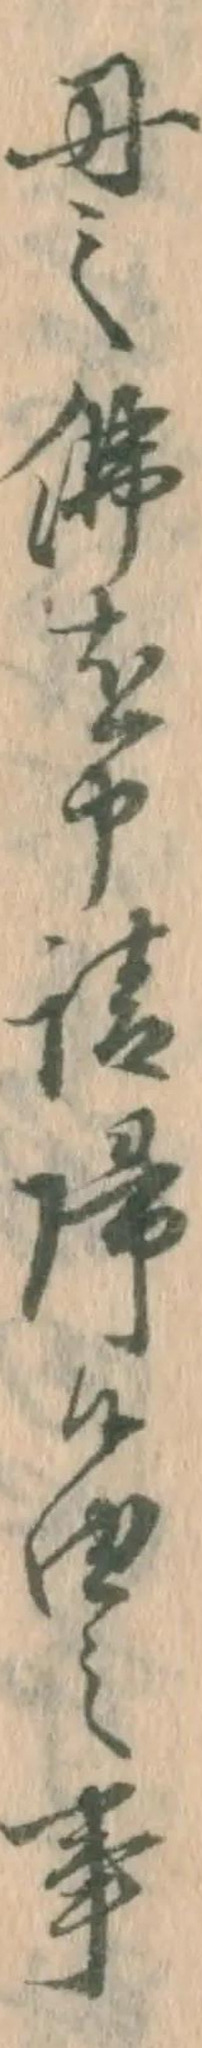丹之仏を申請帰候由之事
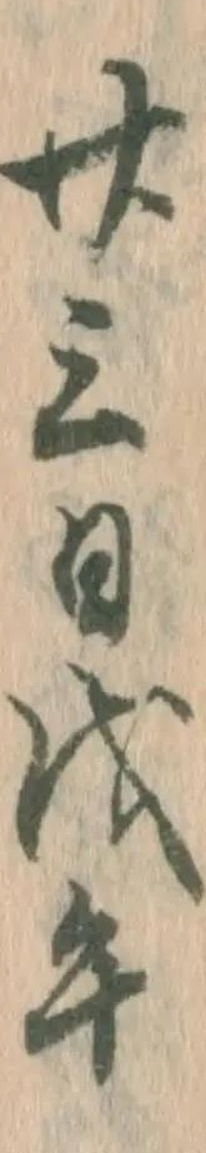廿三日戊午
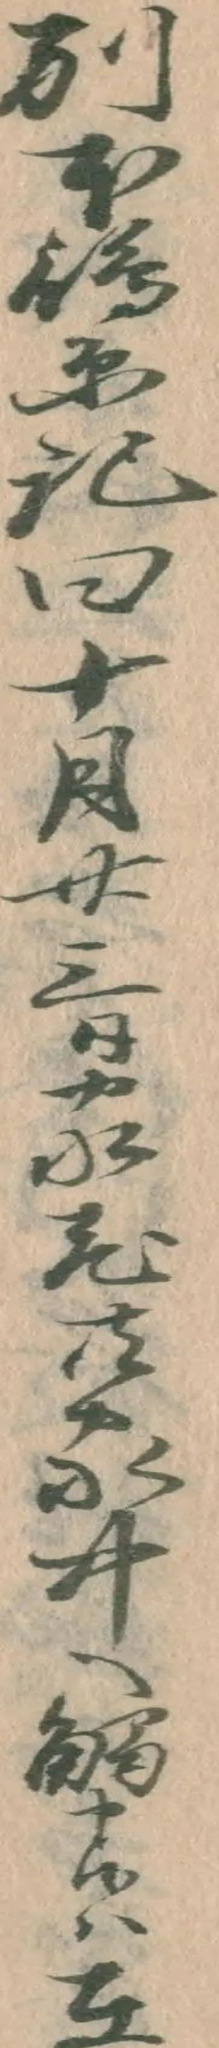別本島原記日十月廿三日家老共家中へ触申候は在
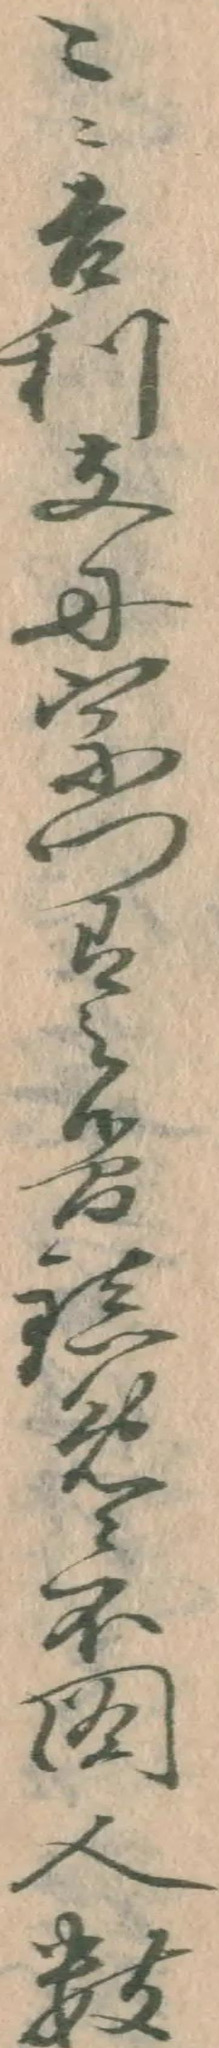々に吉利支丹宗門有之候間鎮めに不図人数
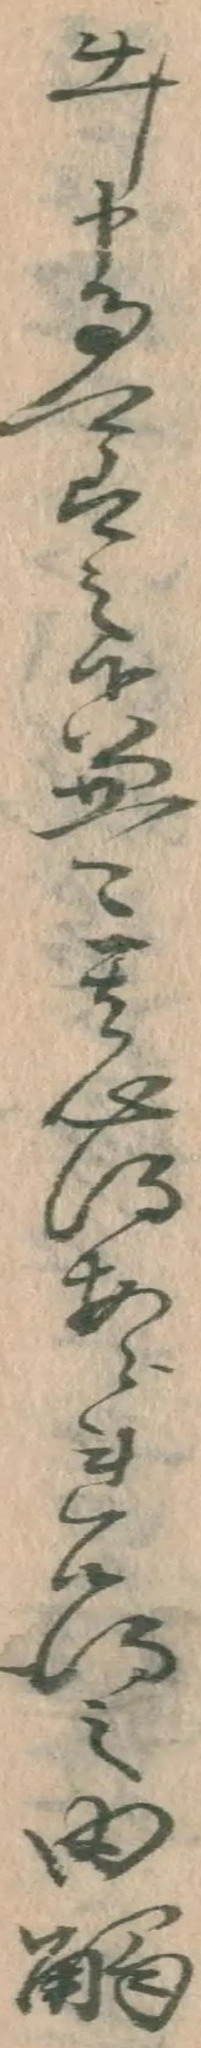出し申事可有之候兼々其心得あられ候得之由触
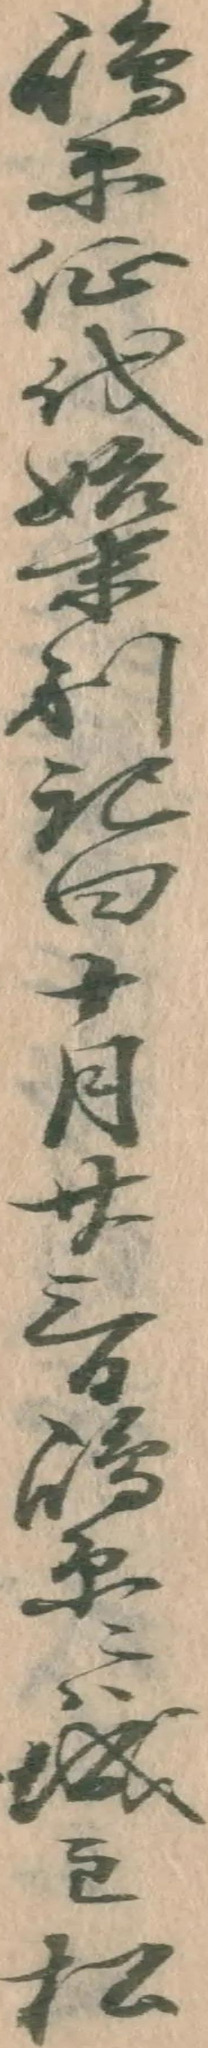島原征伐始末別記日十月廿三日島原には城主松
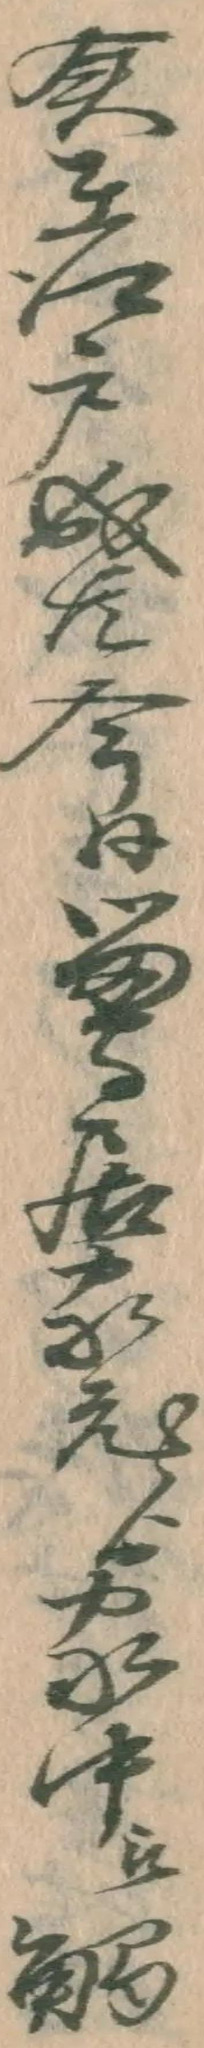倉在江戸成共今日留守居家老ゟ家中え触
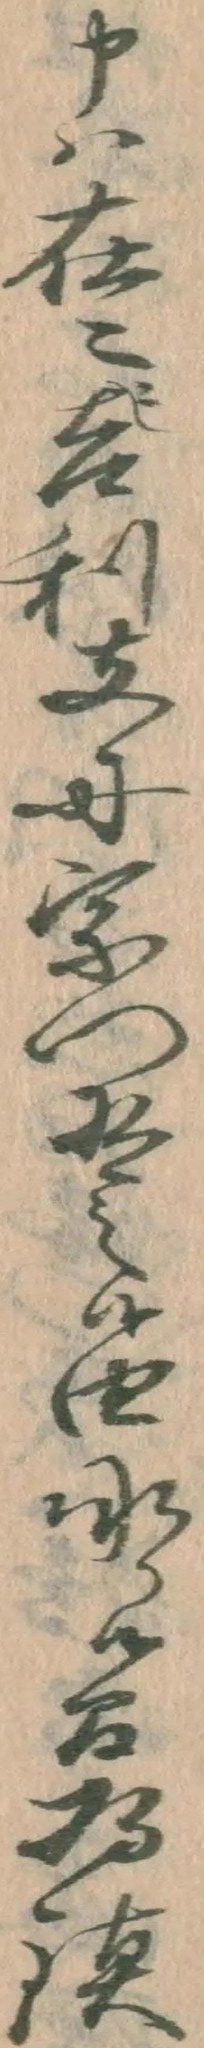申は在々に吉利支丹宗門有之候由承り候間為鎮
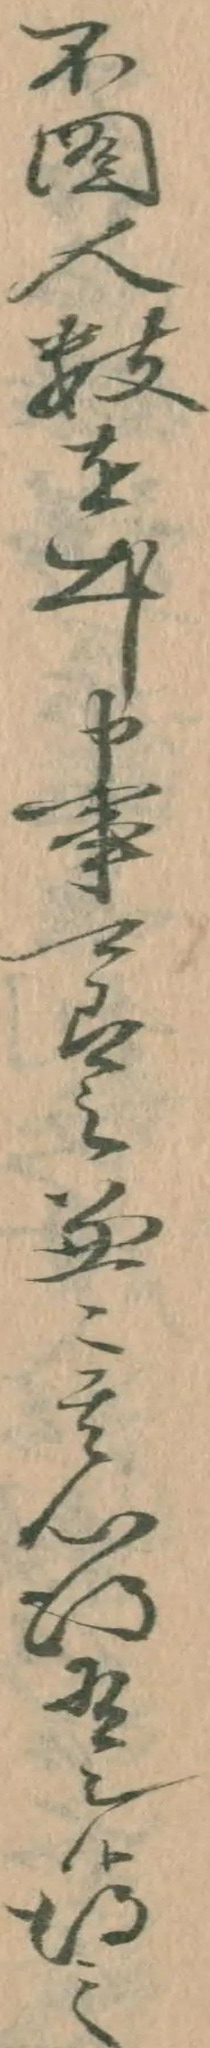不図人数を出し申事可有之兼々其心得有之候得之
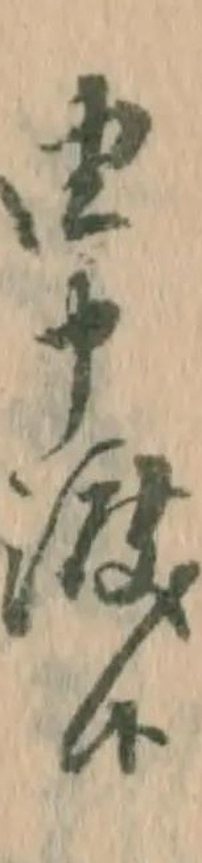由申渡候
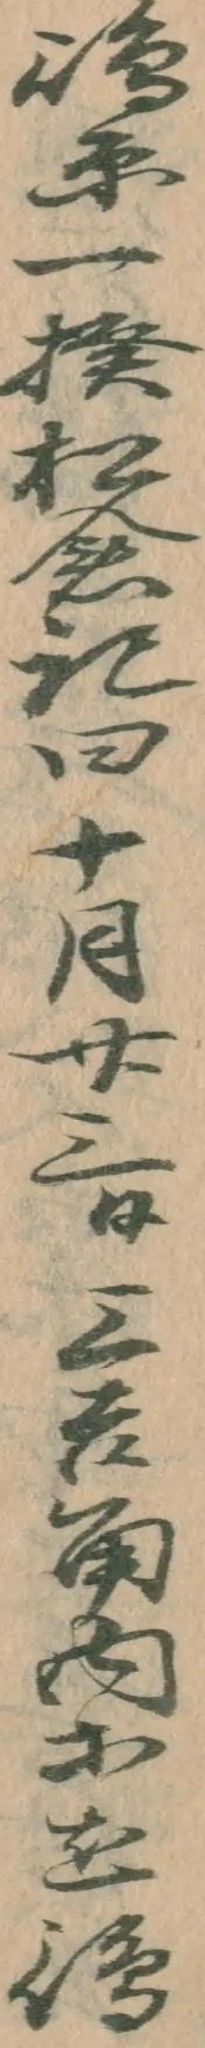島原一揆松倉記日十月廿三日三吉角内等を島
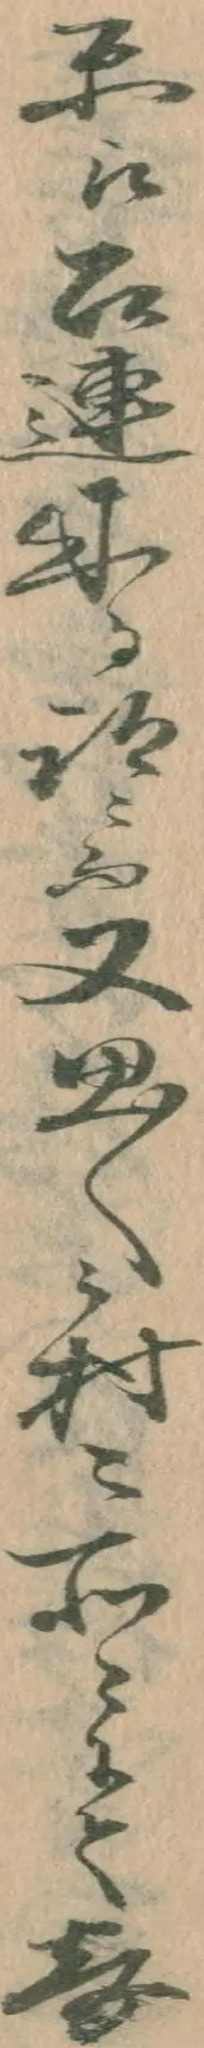原え召連来る跡に而又思〳〵に村々所々にて寄
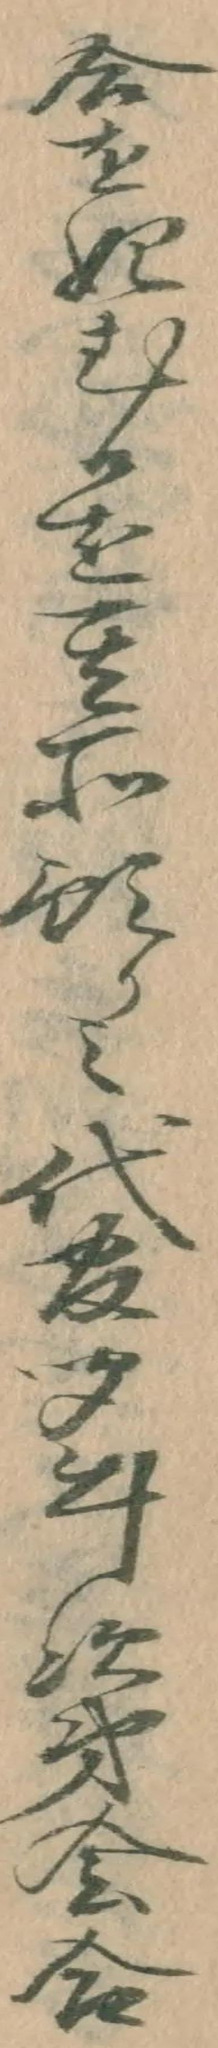合を始む候を其所預り之代官聞斗次第会合
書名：切支丹御退治記 49巻. [1]
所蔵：国立国会図書館 National Diet Library, JAPAN
